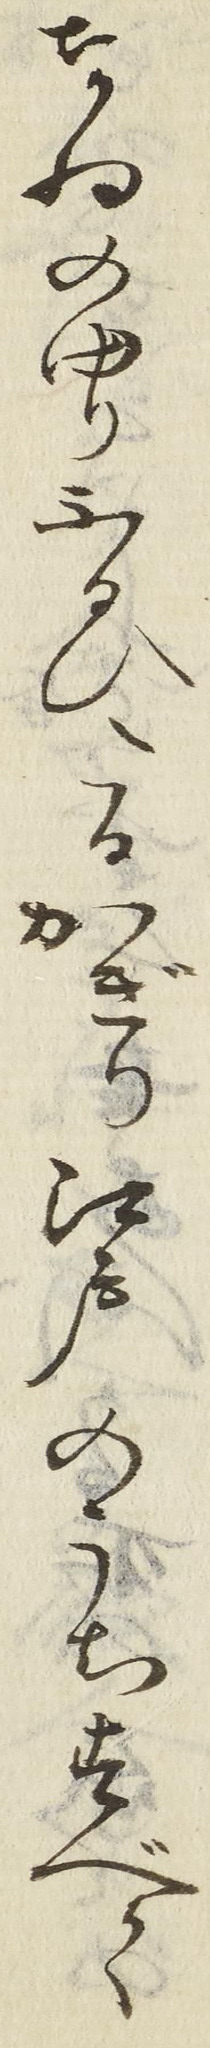なゐのゆりふるひたるかぎり江戸のうちすべて
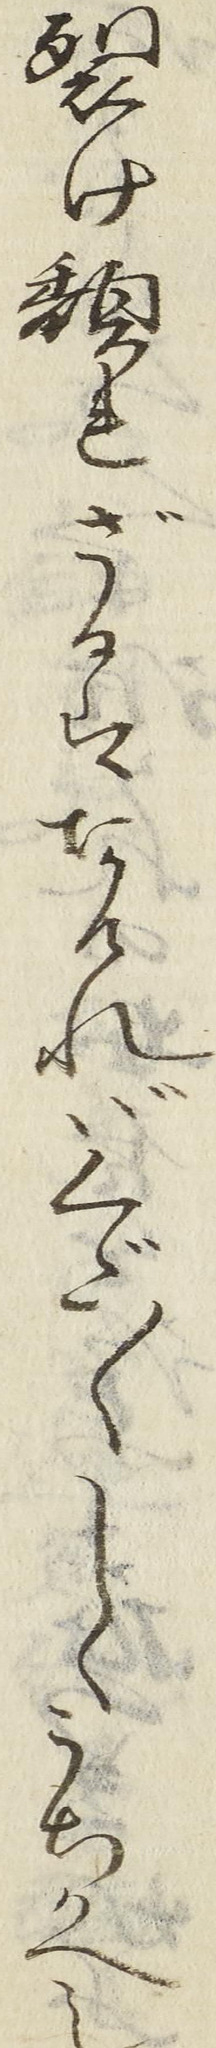裂け頽れざるはなければくだ〳〵しくうちかへし
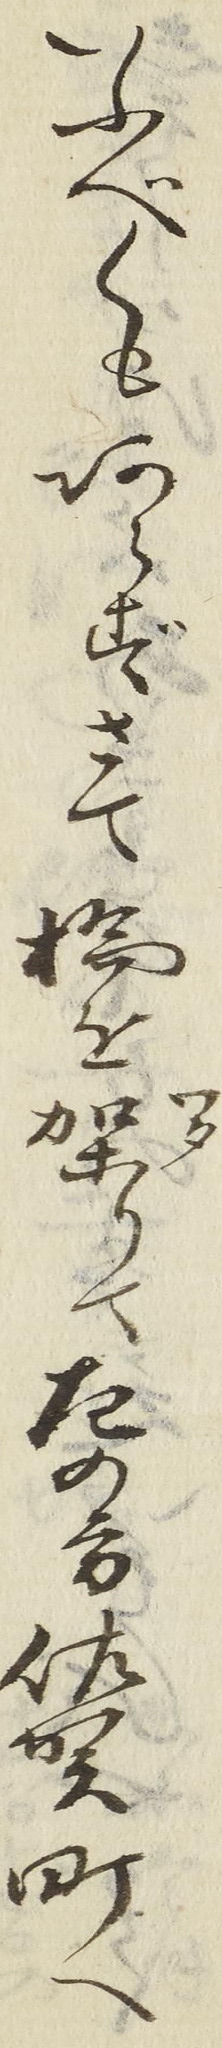いふべくもあらずさて橋を架りて左の方佐賀町へ
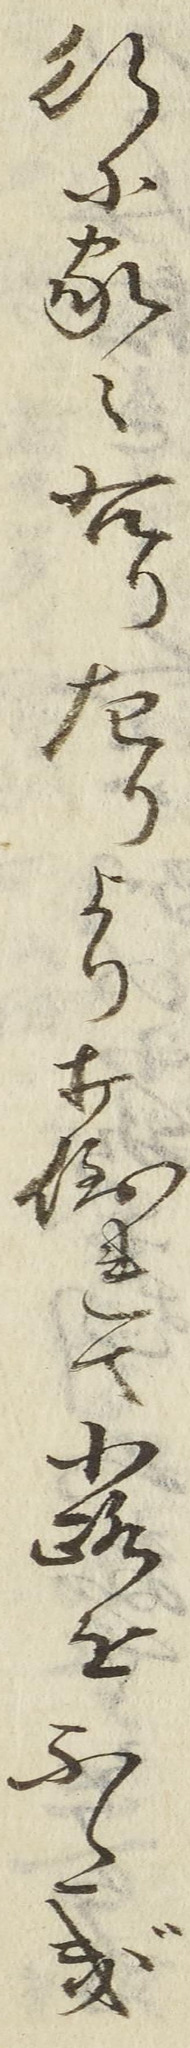行に家〻右り左りより打倒れて小路をふたぎ
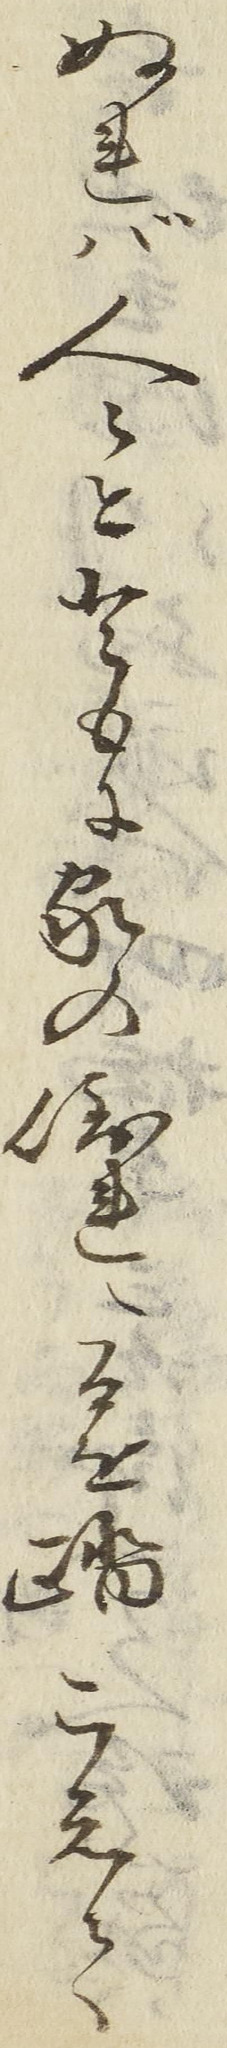ぬれば人〻とともに家の倒れたるを踏こえて

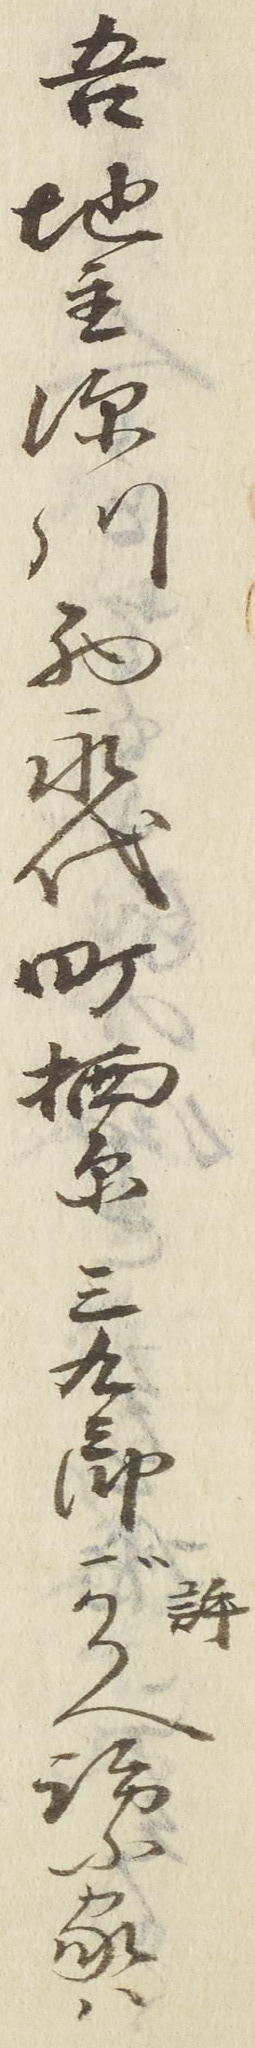吾地主深川永代町栖原三九郎がか許へ訪ふ家は
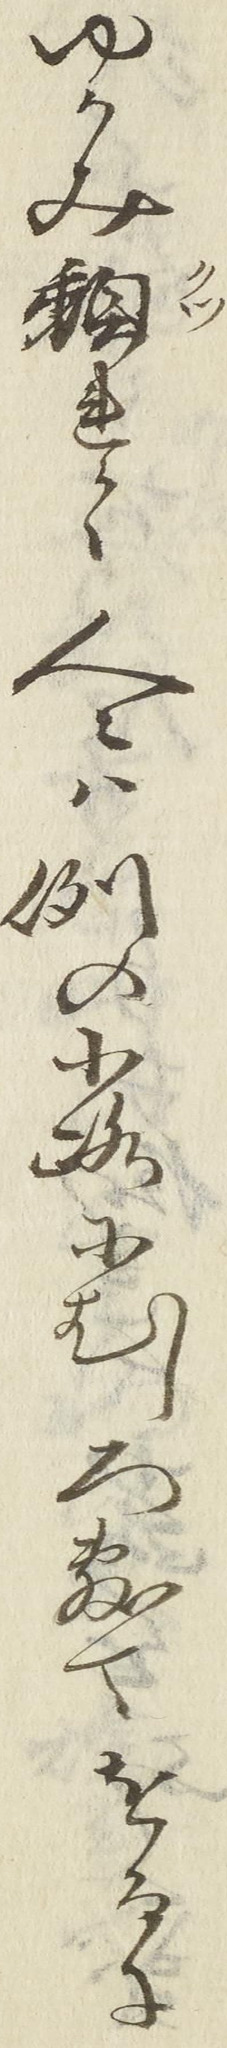ゆかみ頽れて人〻は例の小路にむしろ敷てをるに
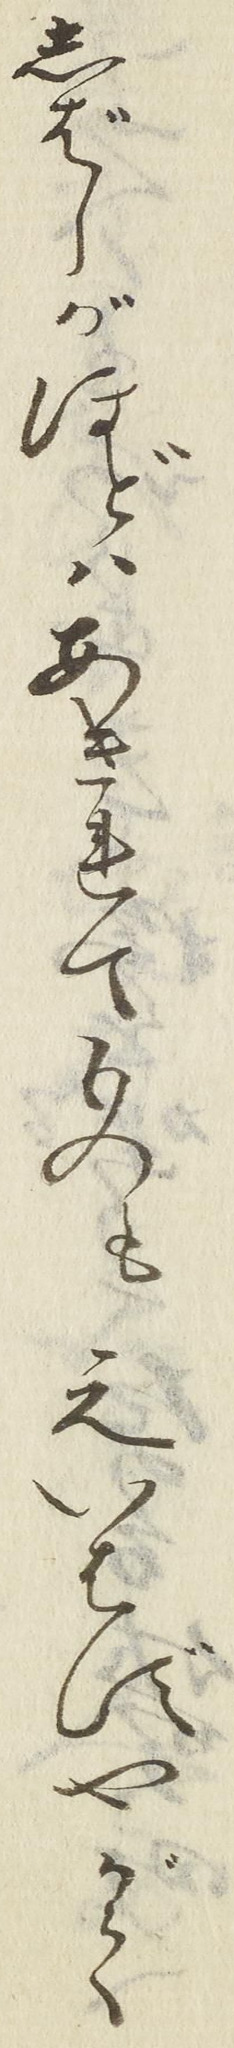しばしがほどはあきれてものもえいはずやがて
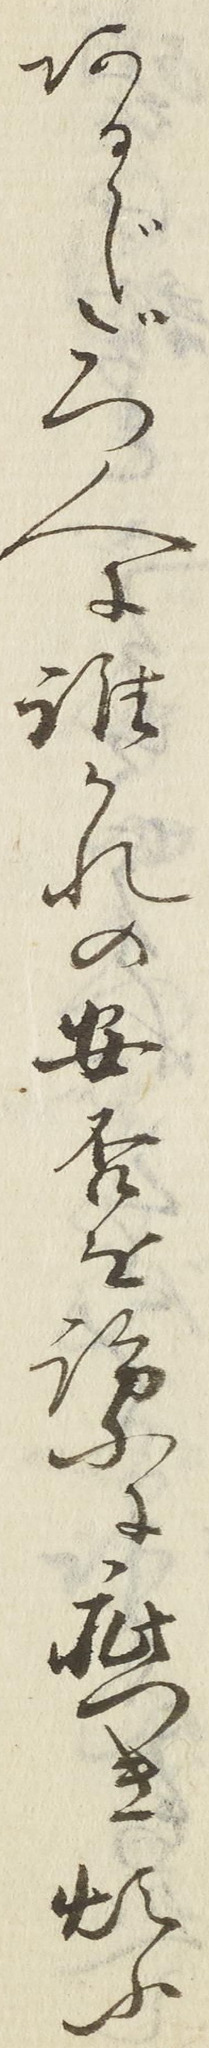あつじだつ人に誰かれの安否を訪ふに疵つき煩ふ
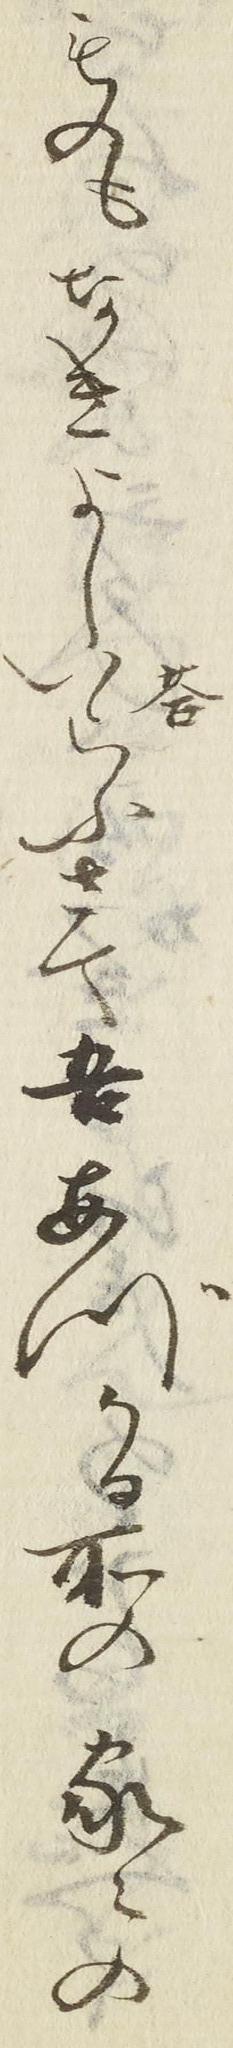ものもなきよしいらふ答さて吾あづかる所の家〻の
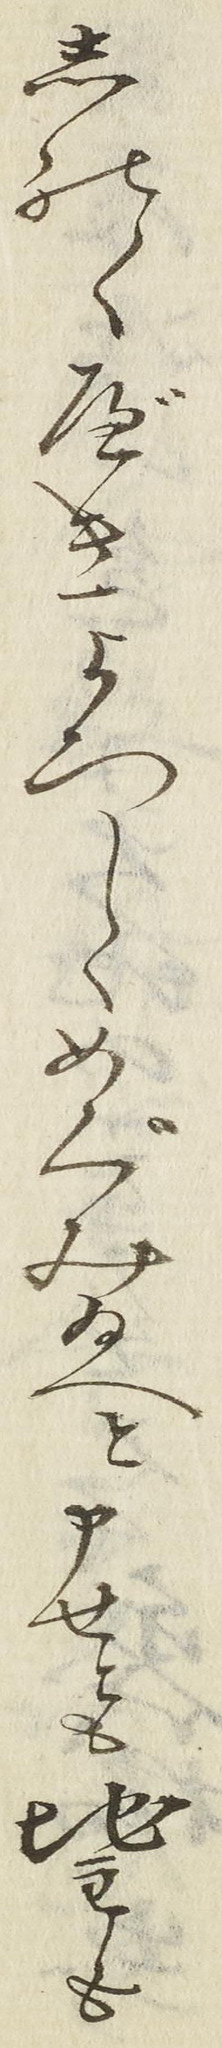しのくべきよろしくめぐみ給へと申せとも地主も
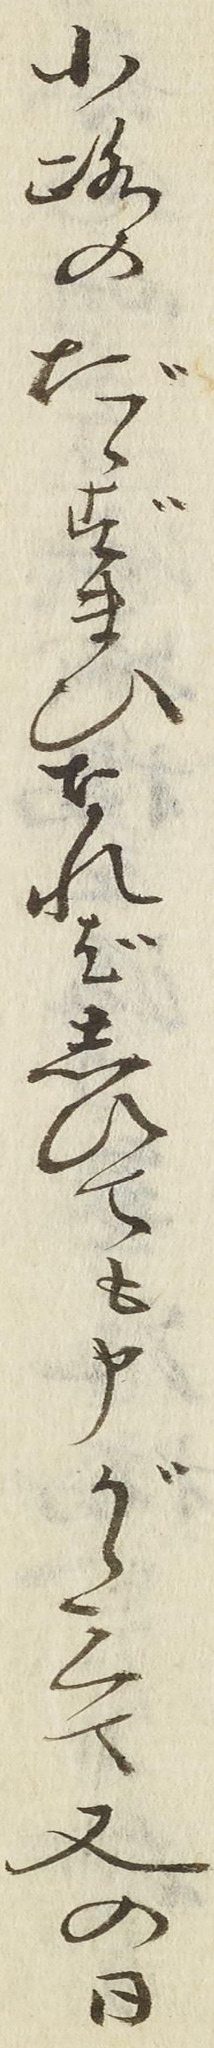小路のだゝずまひなればしひても申がたくて又の日
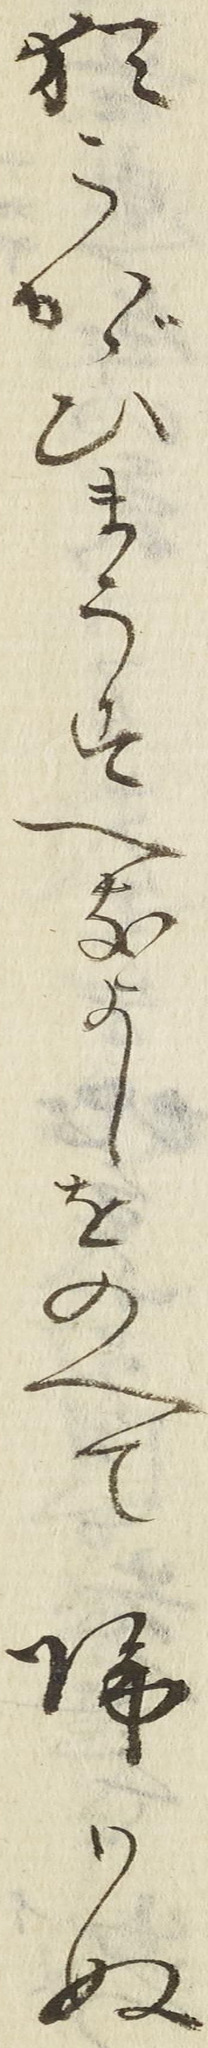猶うかゞひまうすへきよしをのへて帰りぬ
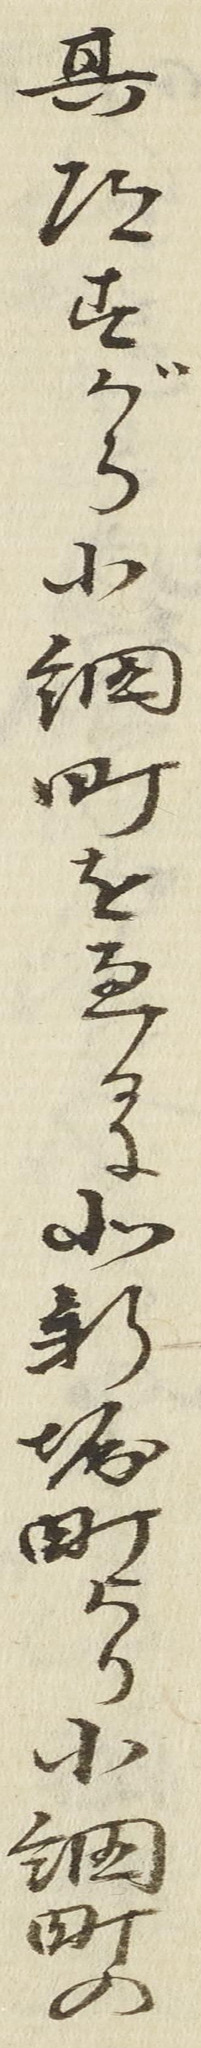其道すがら小網町を過るに北新堀町より小網町の
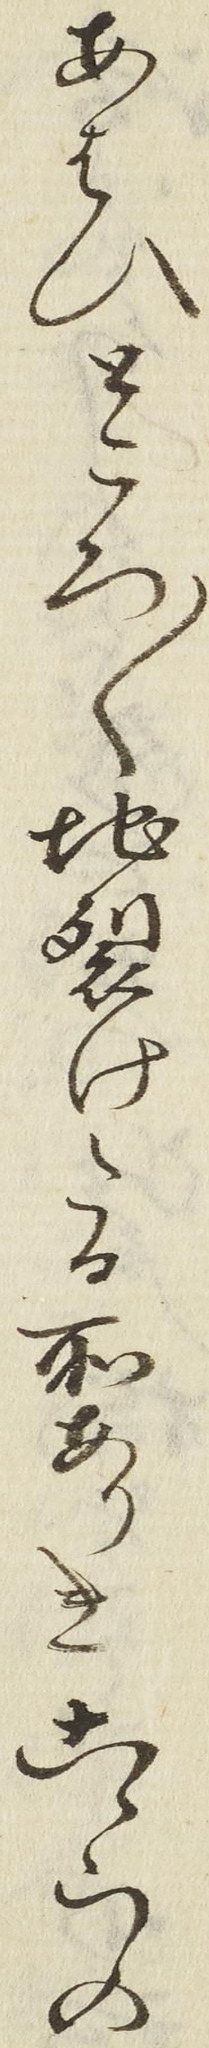あはひところ〳〵地裂けたる所ありきこゝらの
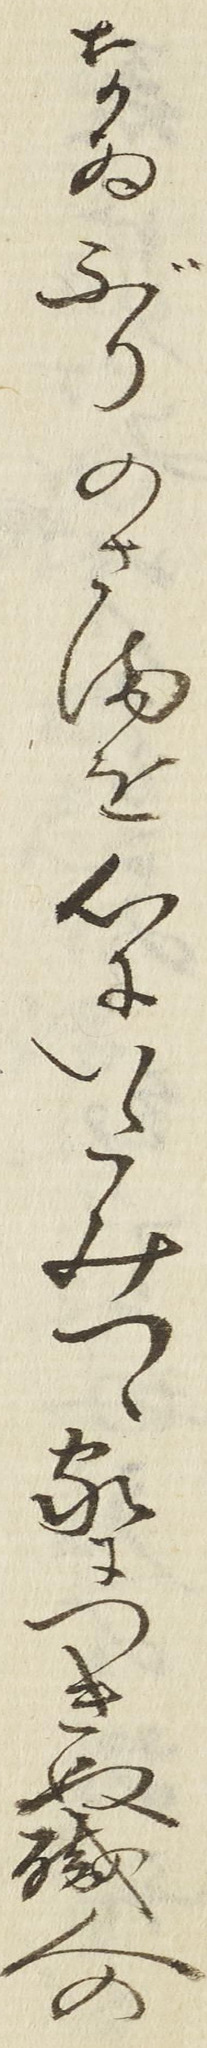なゐぶりのさまを心にいたみつゝ家につきぬ職人の
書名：やぶれ窓の記　全
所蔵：東京大学地震研究所図書室 Earthquake Research Institute Library, The University of Tokyo, JAPAN
